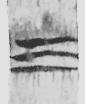三
